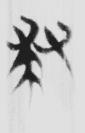{求又}
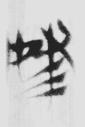{女𦘔}
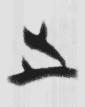之
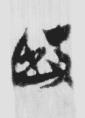臤
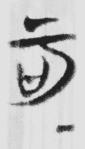可
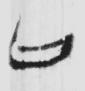㠯（以）
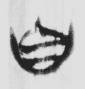自
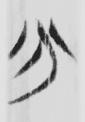分
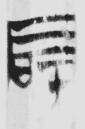砫
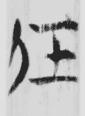任
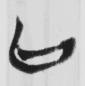㠯（以）
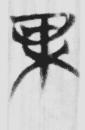果
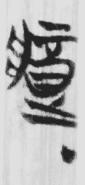{𨟻止}
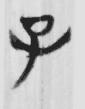子
